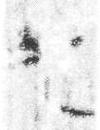民
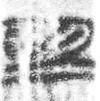則（則）
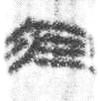夜
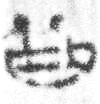皆
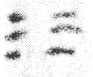三
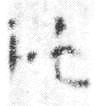代
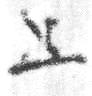之
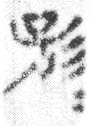孫子
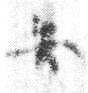夫
